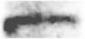一
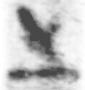之
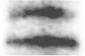二
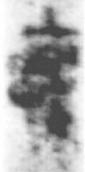○（秦）
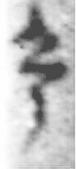弓
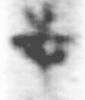矢
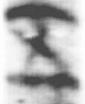五
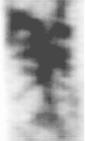秉
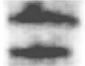二
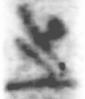之
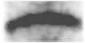一
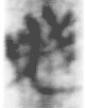○（戟）
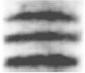三
